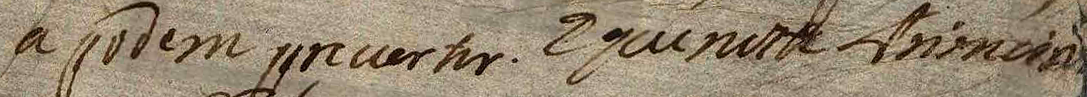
a podem preuerter. E que neste Primeir
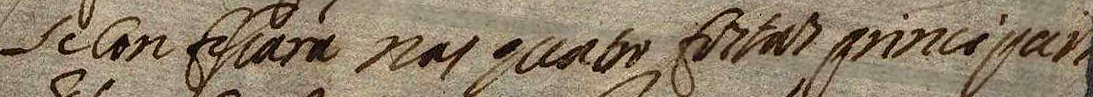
se confessará nas quatro festas principai
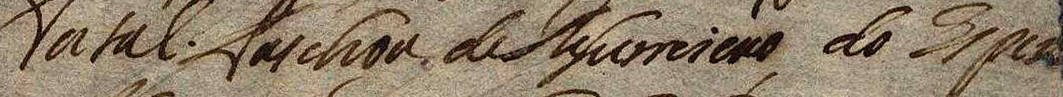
Natal. Paschoa de Resurreição, do Espir
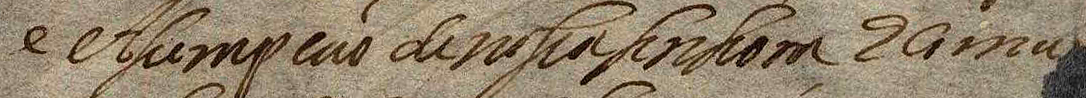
e Asumpçaõ de nossa senhora, E comun
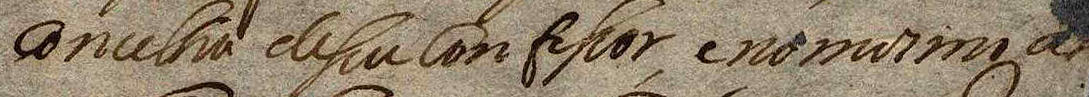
concelho de seu Confessor, e no mesmo a
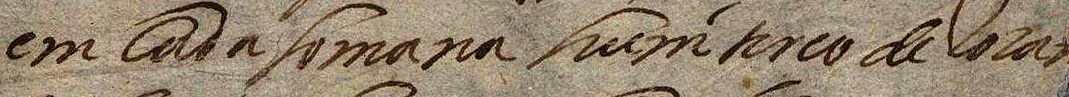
em Cada somana hum terço de Rozar
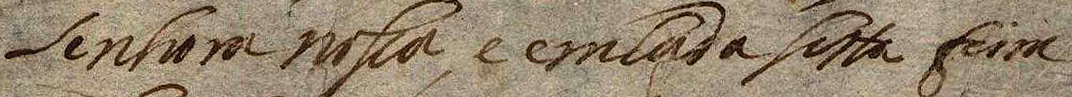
senhora nossa, e em Cada sesta feira
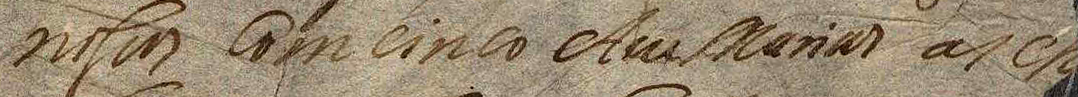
nossas Com cinco Aue Marias as ch
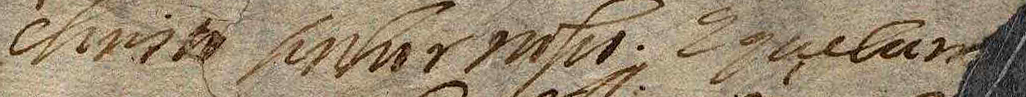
christo senhor nosso. E que Cum
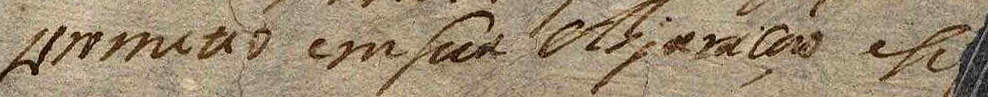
prometeo em sua Abjuraçaõ e se
